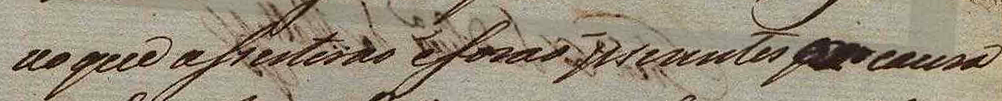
ao que assestiraõ e foraõ prezentes p_r cauza
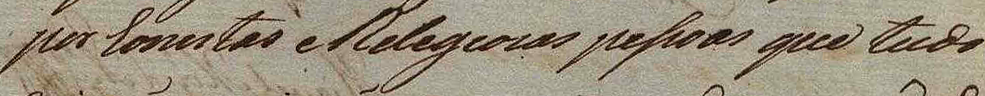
per honestas e Relegiozas pessoas que tudo
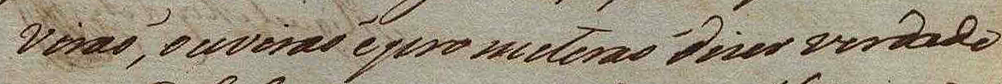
viraõ, ouviraõ e prometeraõ dizer verdade
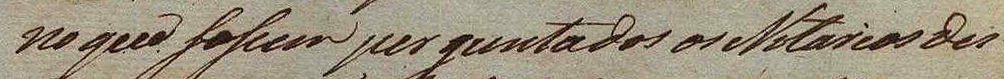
no que fossem perguntados os Notarios des
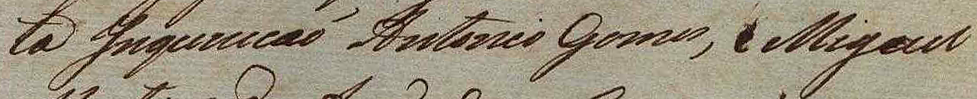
ta Jnquisicaõ Antonio Gomes, e Miguel
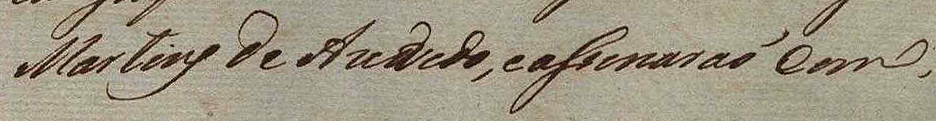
Martins de Azevedo, e assinaraõ com
